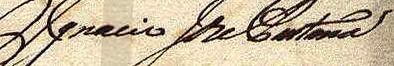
Giraldo Ioze de Abranches
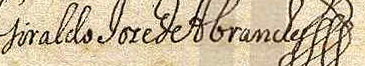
O Jgnacio Joze Pastana
